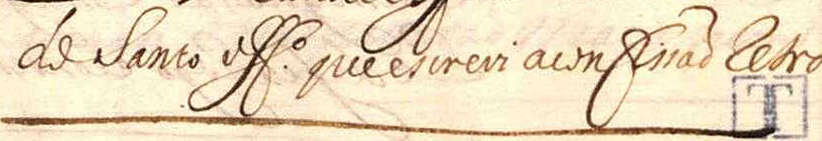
do Santo off.o que escrevi a confissaõ Retro
